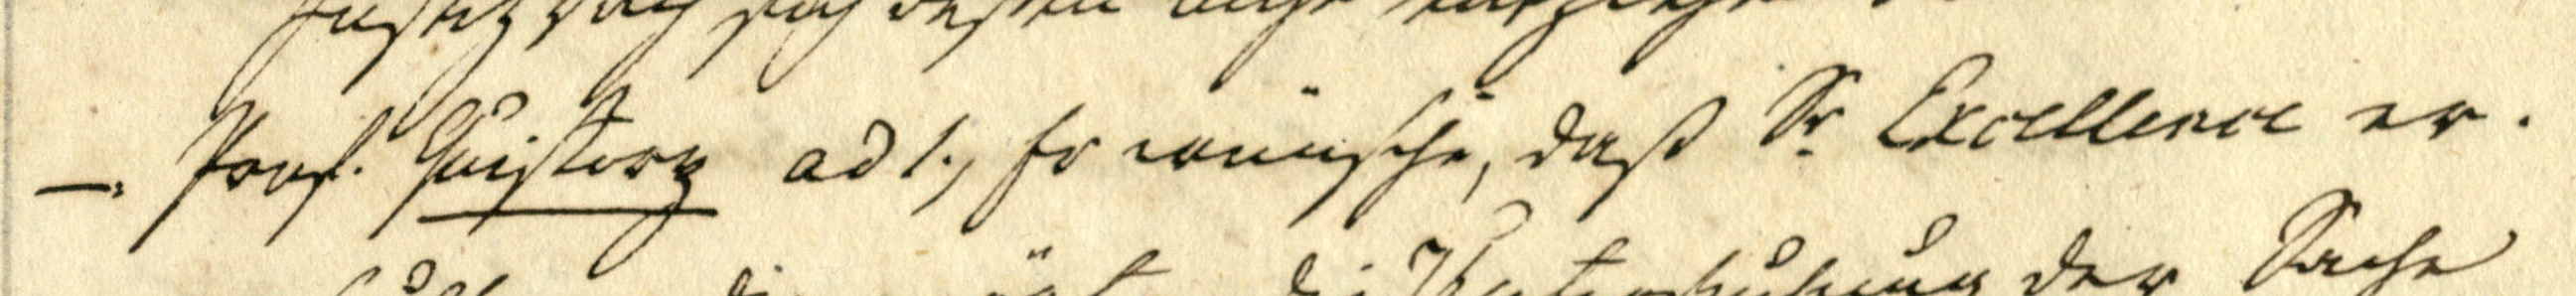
— Prof. Quistorp ad 1., Er wünsche, daß Sr Excellence er¬
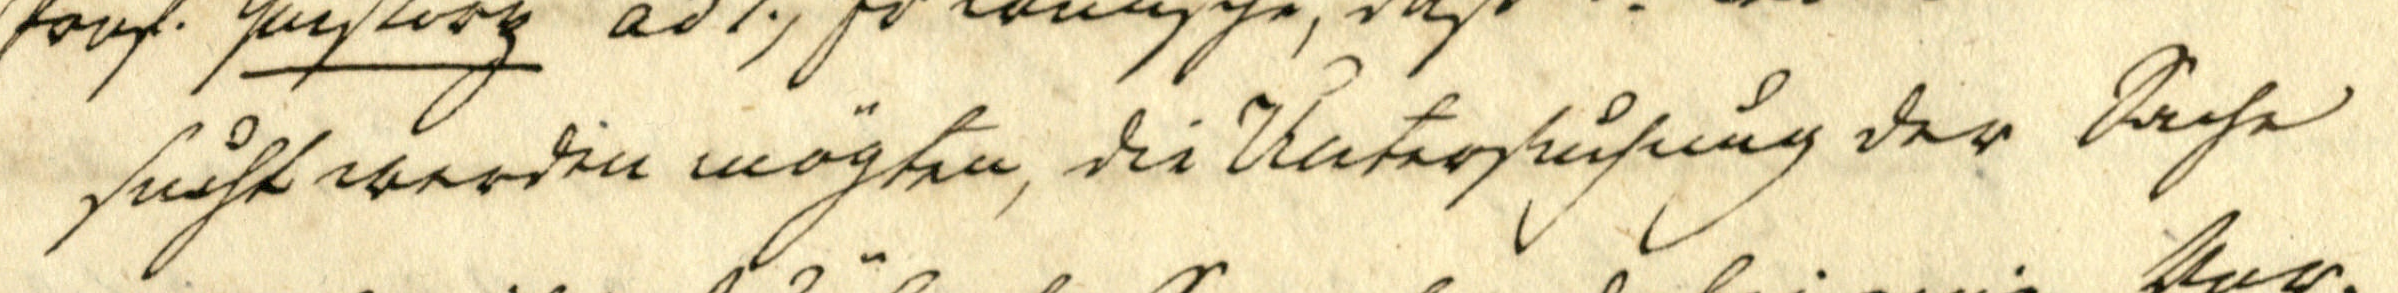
sucht werden mögten, die Untersuchung der Sache
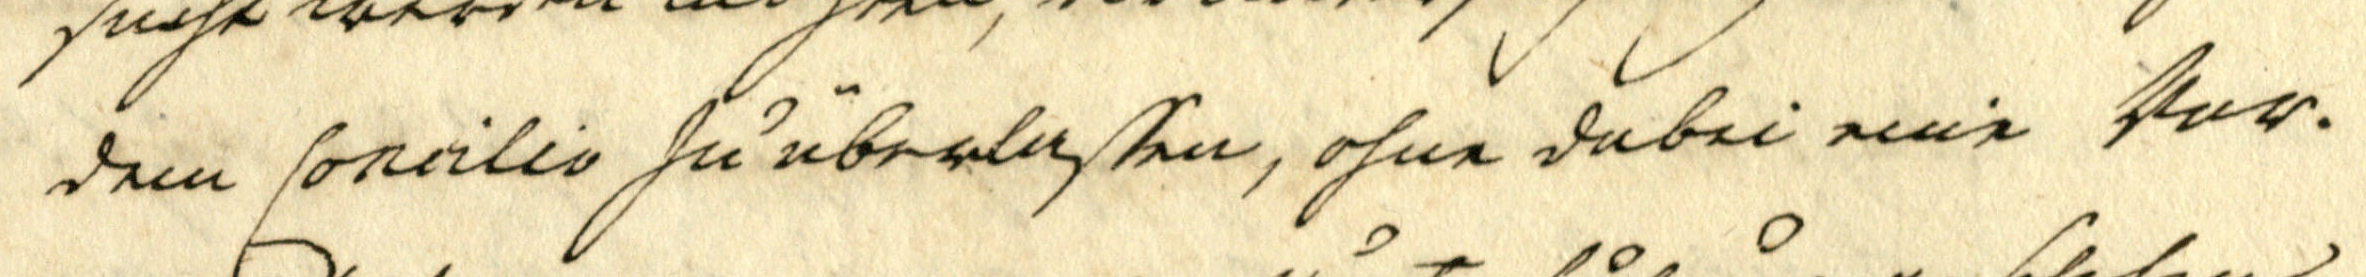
dem Concilio zu überlassen, ohne dabei eine Vor¬
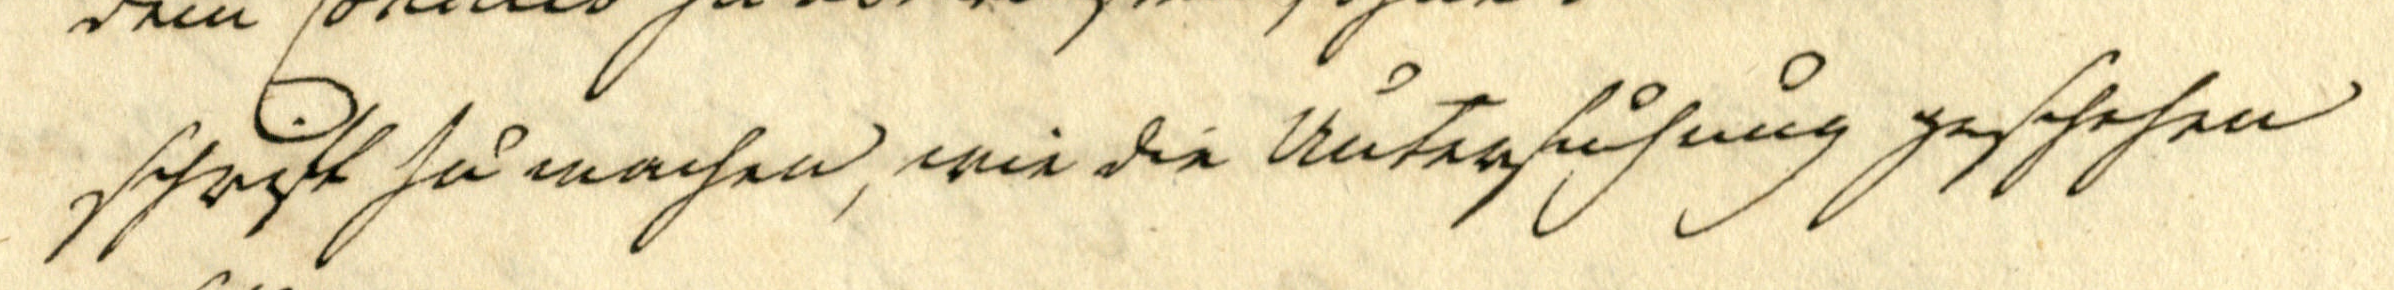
schrift zu machen, wie die Untersuchung geschehen
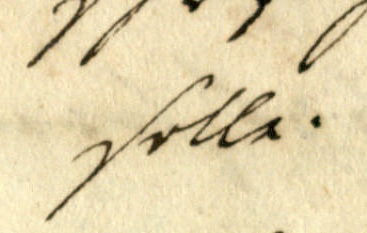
solle.
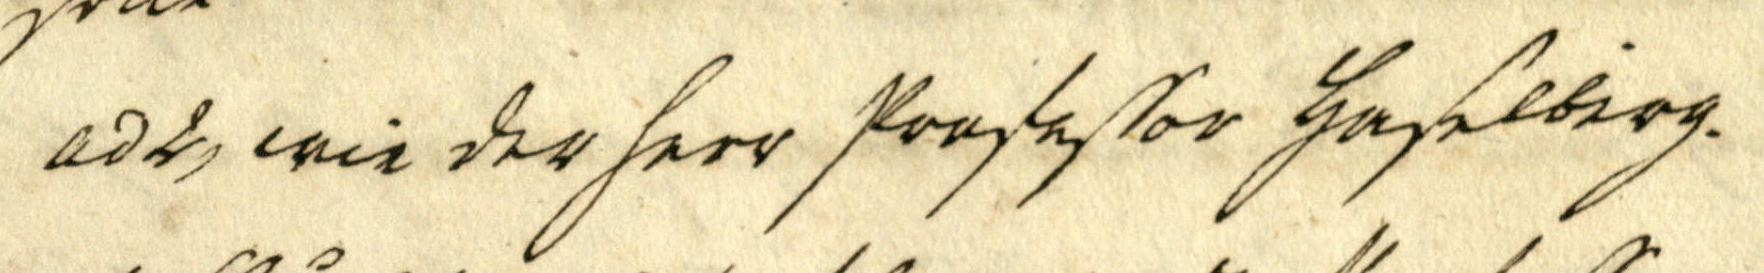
ad 2, wie der Herr Professor Haselberg.
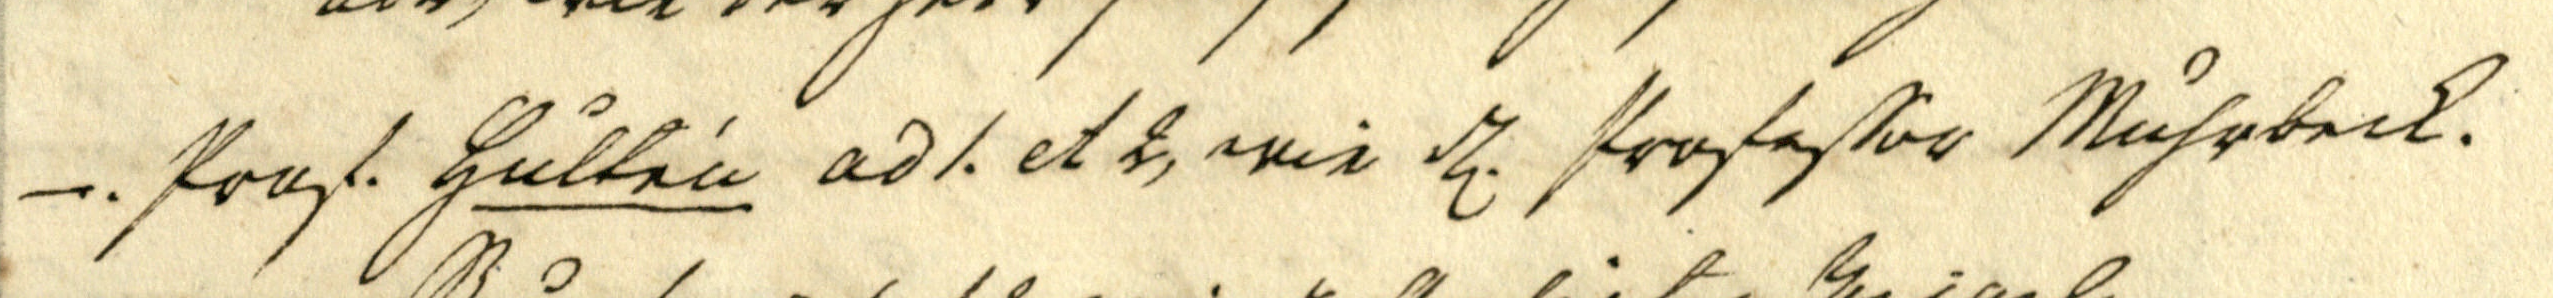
— . Prof. Hultén ad 1. et 2, wie dh. Professor Muhrbeck.
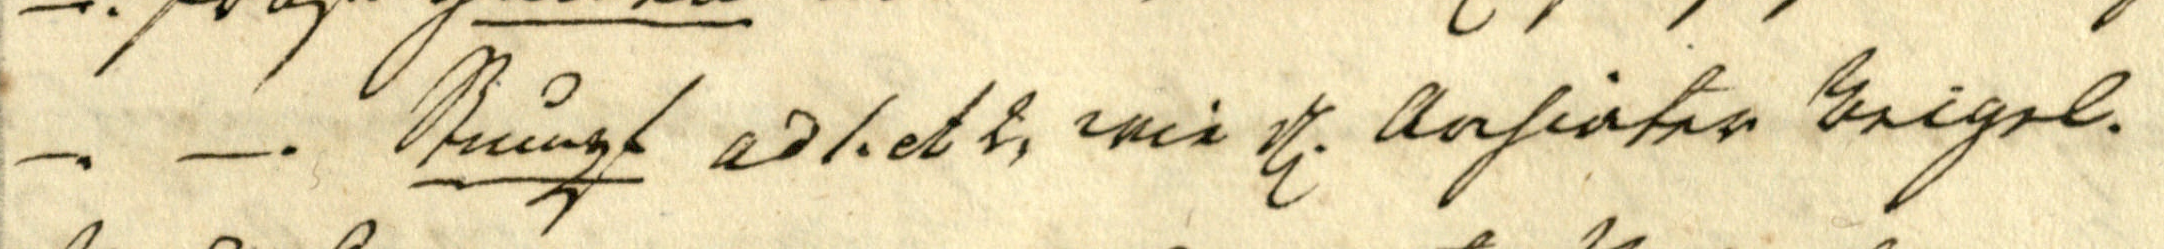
- — . Stumpf ad 1. et 2. wie dh. Archiater Weigel.
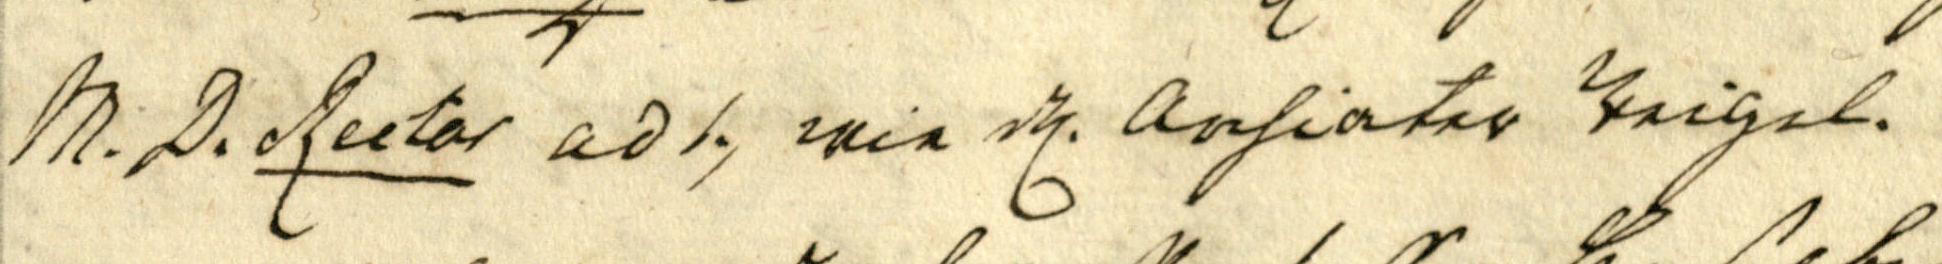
M. D. Rector ad 1., wie dh. Archiater Weigel.
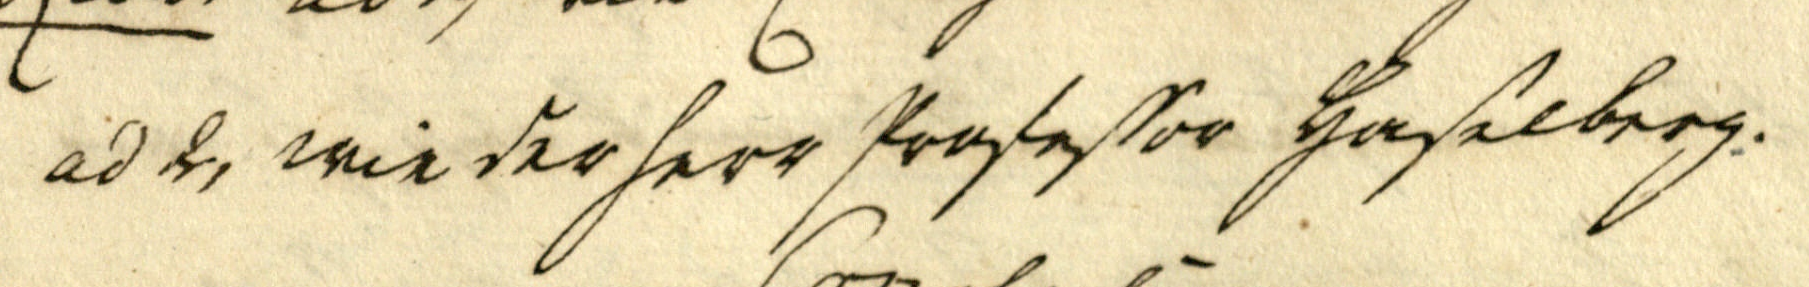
ad 2, wie der Herr Professor Haselberg.
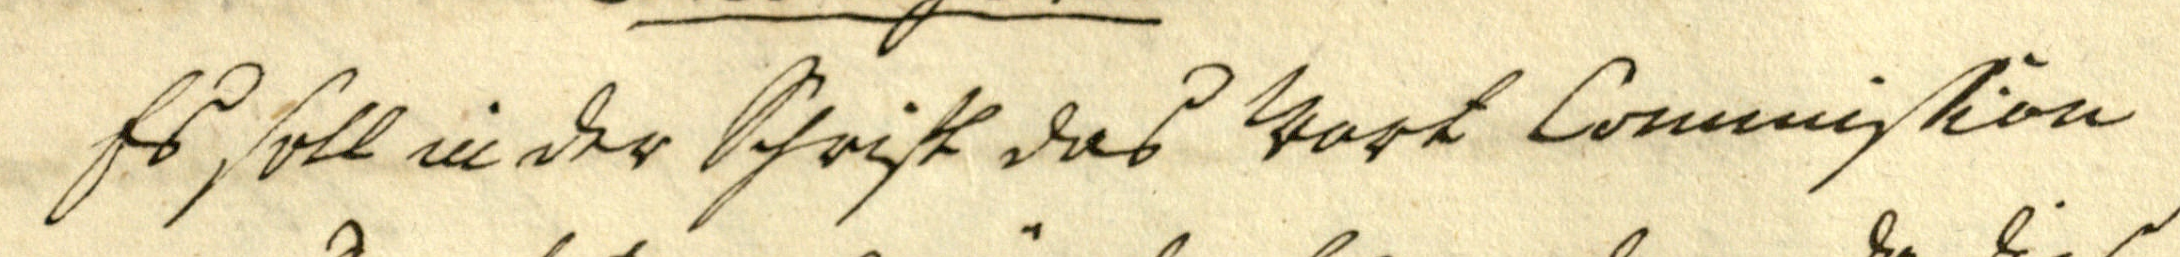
Es soll in der Schrift das Wort Commission
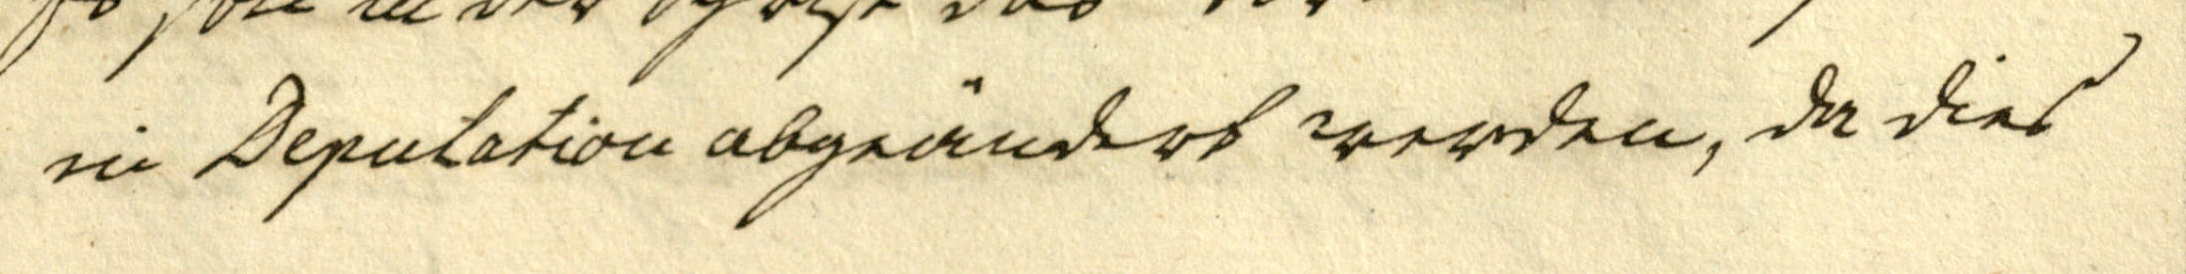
in Deputation abgeändert werden, da dies
